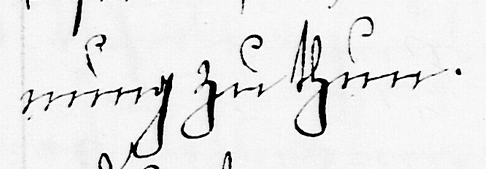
nung zu thun.
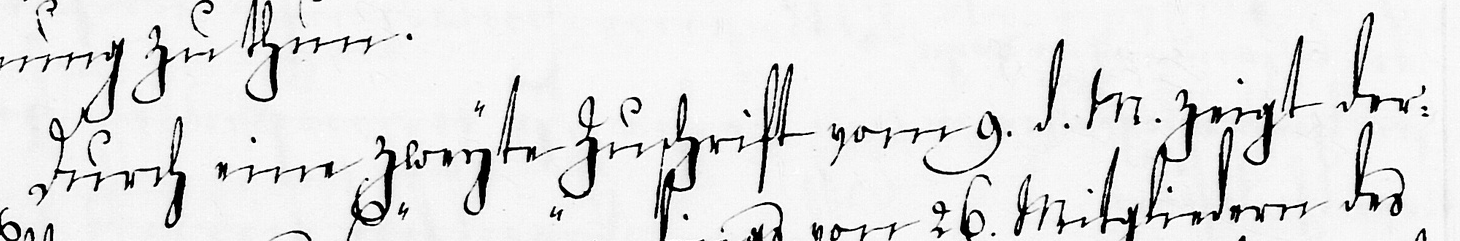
Durch eine zweyte Zuschrift vom 9. d. M. zeigt der¬
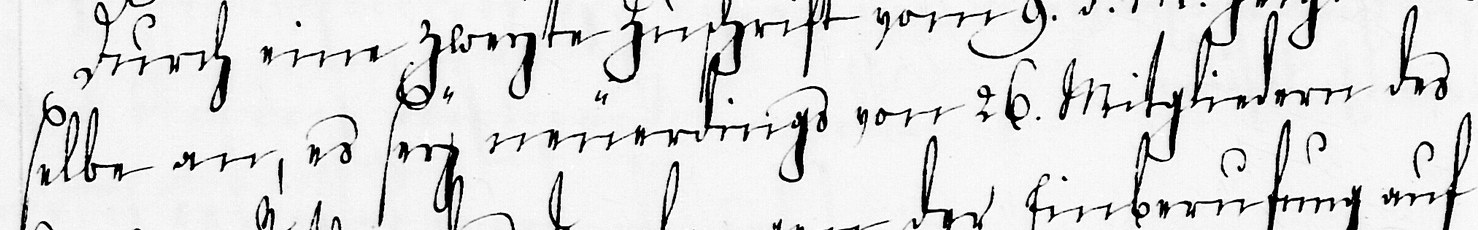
selbe an, es sey neuerdings von 26. Mitgliedern des
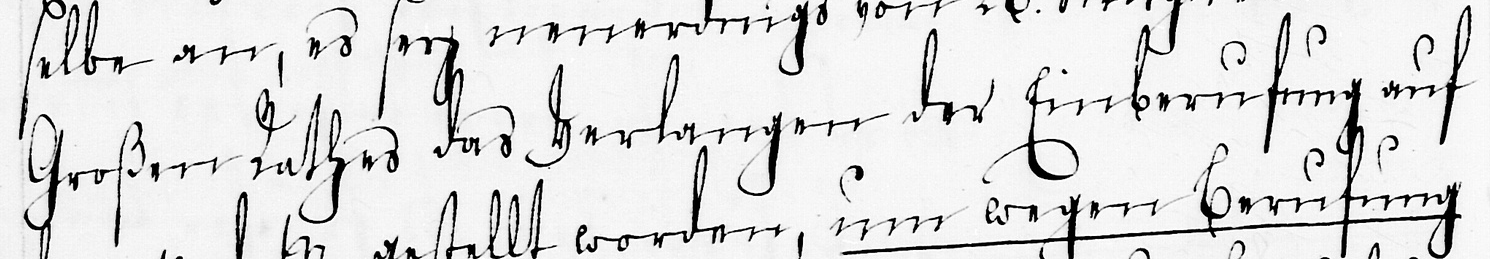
Großen Rathes das Verlangen der Einberufung auf
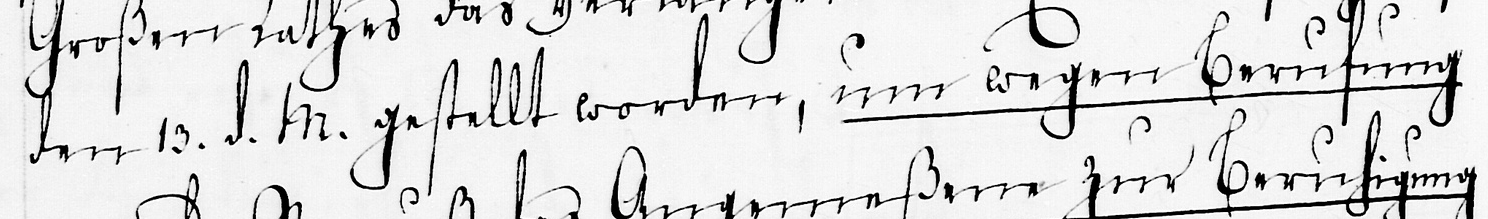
den 13. d. M. gestellt worden, um wegen Berufung
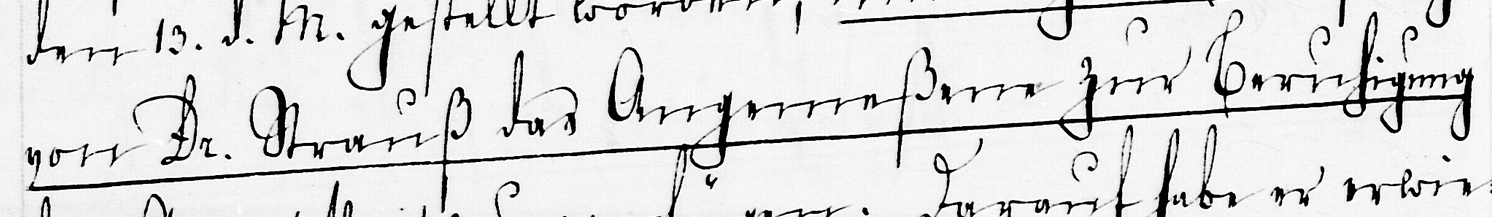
von Dr. Strauß das Angemeßene zur Beruhigung
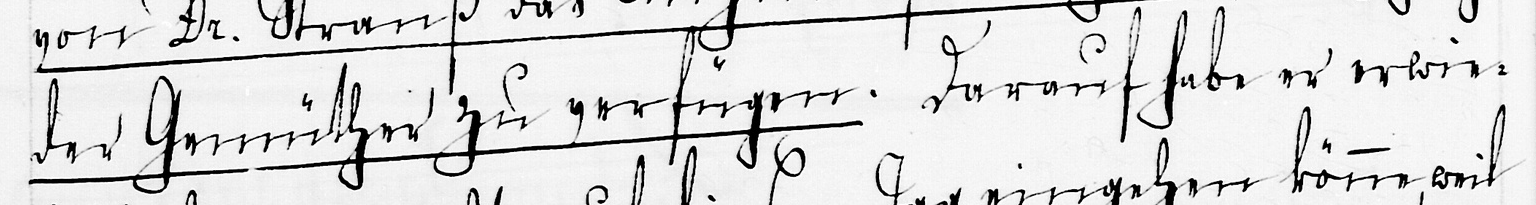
der Gemüther zu verfügen. Darauf habe er erwie¬
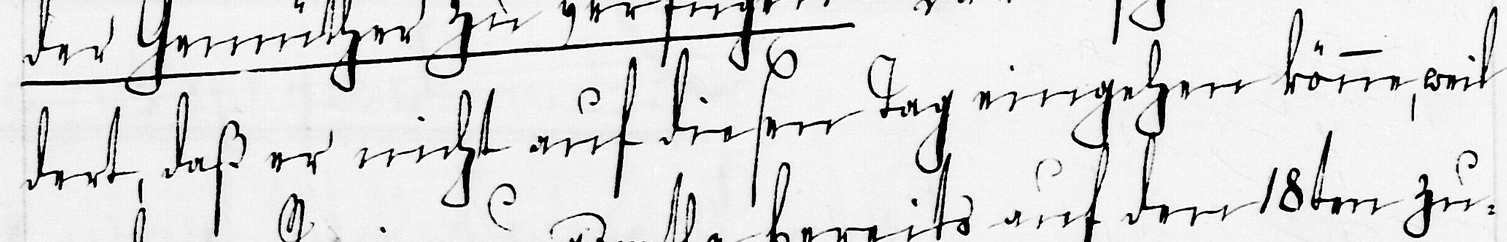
dert, daß er nicht auf diesen Tag eingehen könne,
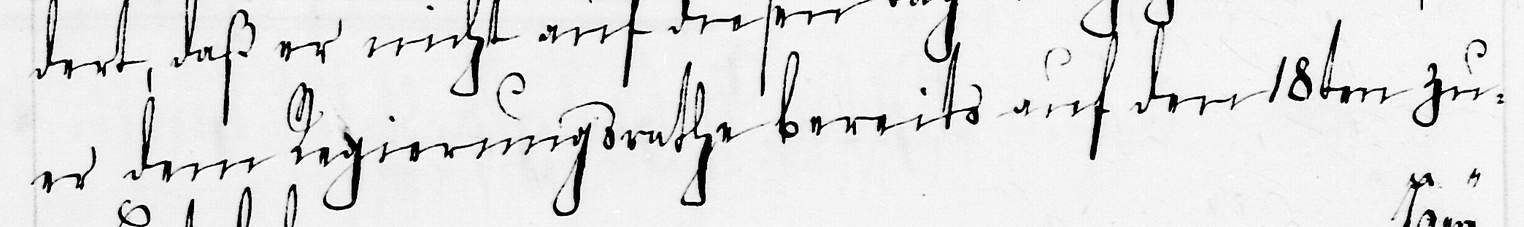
er dem Regierungsrathe bereits auf den 18ten zu¬
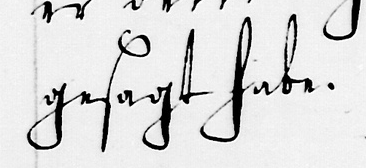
gesagt habe.
